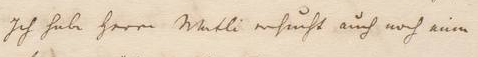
Ich habe Herrn Wetli ersucht auch noch eine
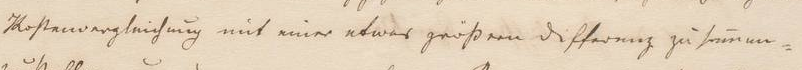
Kostenvergleichung mit einer etwas grösern Differenz zusammen--
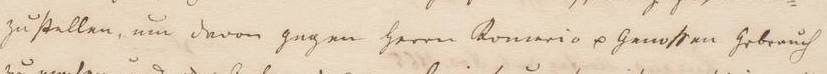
zustellen, um davon gegen Herrn Romerio & Genossen Gebrauch
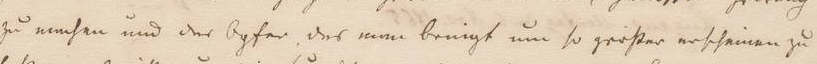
zu machen und das Opfer, das man bringt um so größer erscheinen zu
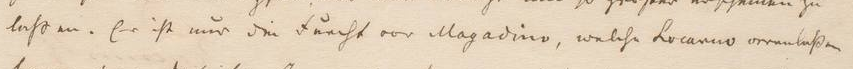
laßen. Es ist nur die Furcht vor Magadino, welche Locarno veranlaßen
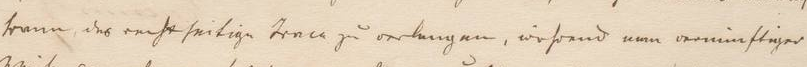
kann, das rechtseitige Trace zu verlangen, während man vernünftiger
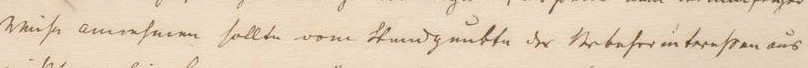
Weise annehmen sollte vom Standpunkte der Verkehrsintereßen aus
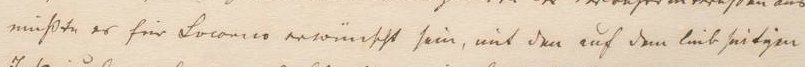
müßte es für Locarno erwünscht sein, mit den auf dem linkseitigen
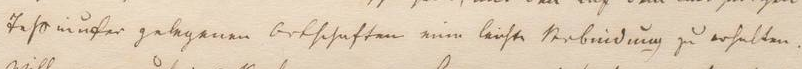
Tessinufer gelegenen Aortschaften eine leichte Verbindung zu erhalten.
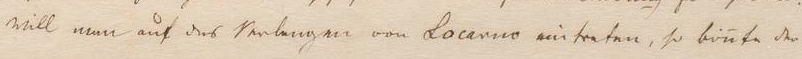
Will man auf das Verlangen von Locarno eintreten, so könnte der
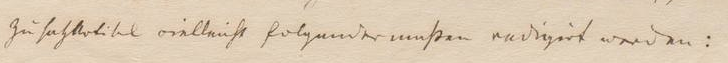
Zusatztitel vielleicht folgendermaßen redigirt werden:
